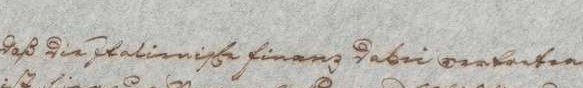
daß die Italienische Finanz dabei vertreten
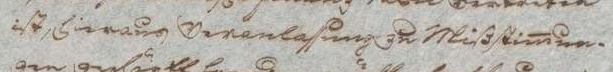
ist, hieraus Veranlassung zu Mißstimmun-
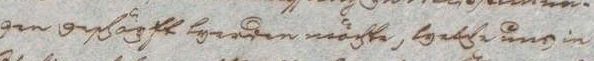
gen geschöpft werden möchte, welche uns in
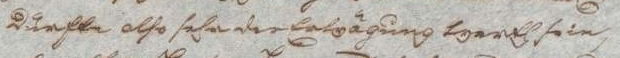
dürfte also sehr der Erwägung werth sein,
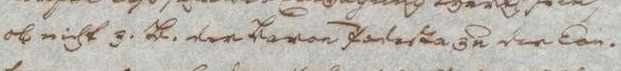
ob nicht z. B. der Baron Podesta zu der Con-
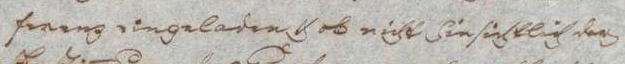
ferenz eingeladen & ob nicht hinsichtlich der
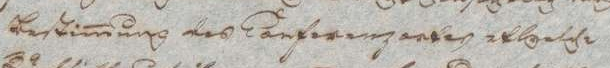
Bestimmung des Conferenzortes etwelche
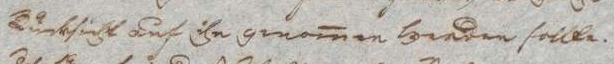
Rücksicht auf ihn genommen werden sollte.
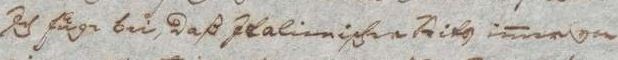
Ich füge bei, daß Italienischer Seits immer von
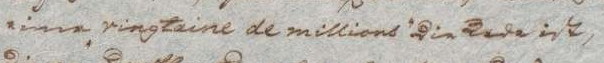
einer «vingtaine de millions» die Rede ist,
